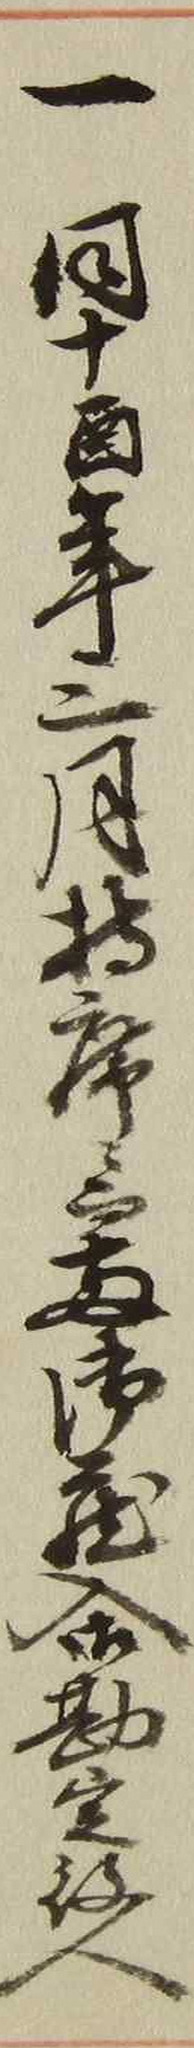一同十酉年二月持席に而両御蔵入御勘定役人
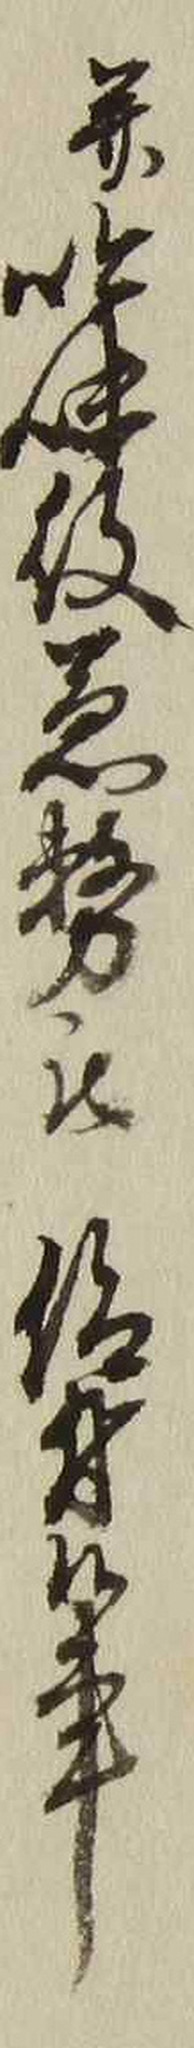并吟味役兼務被仰付候事
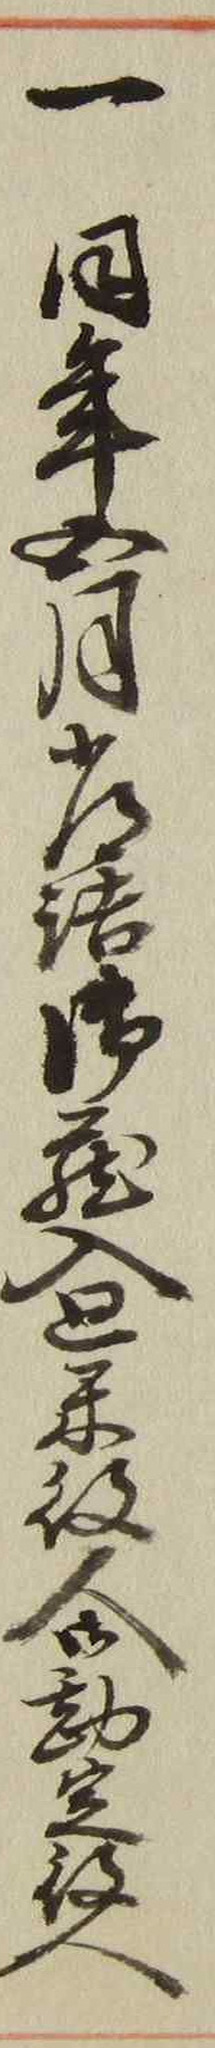一同年五月常詰御蔵入廻米役人御勘定役人
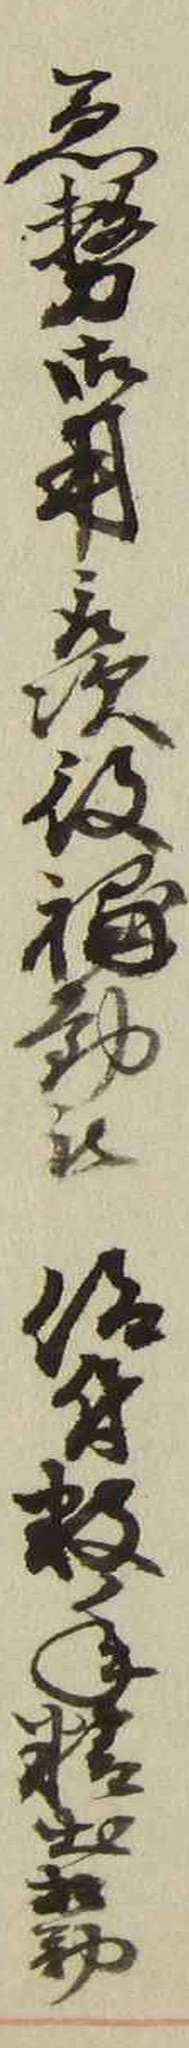兼務御用取次役補勤被仰付数年精出相勤
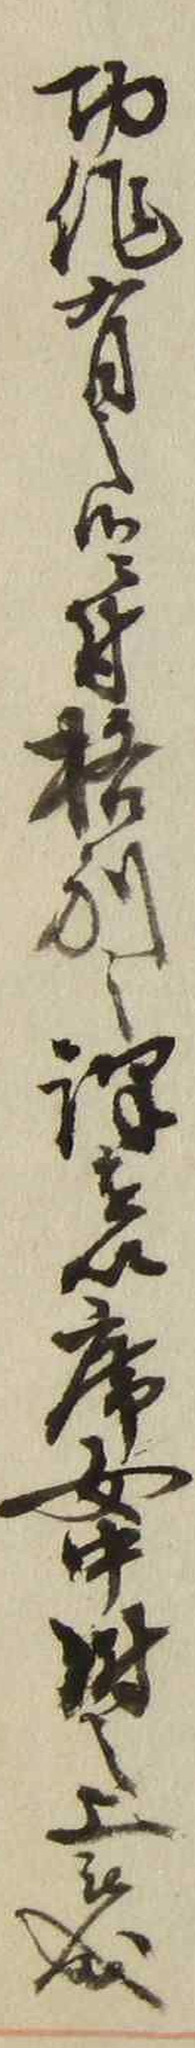功作有之候に付格別之訳を以席女中附之上被成

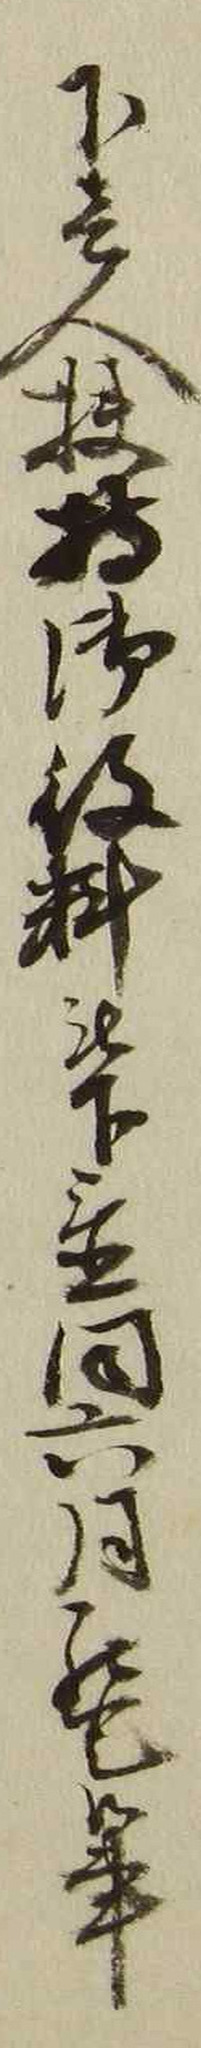下壱人扶持御役料被下置同六月罷登候事
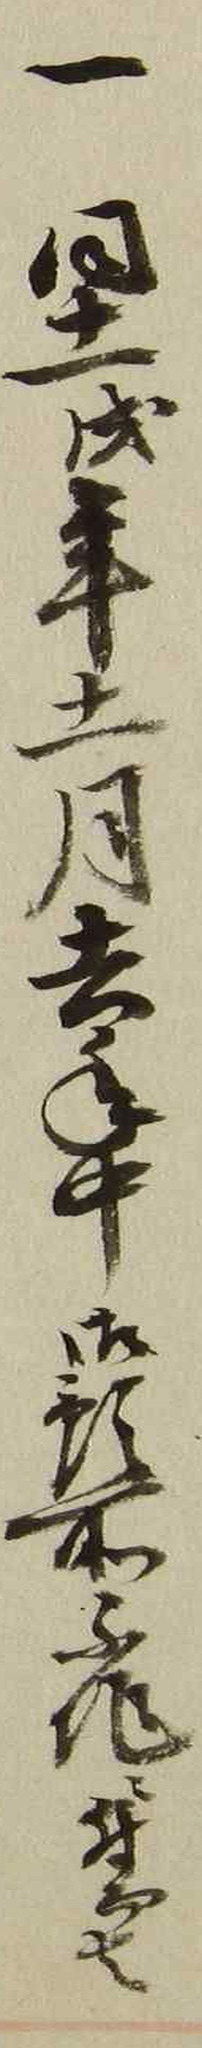一同十一戌年十一月去年中御預所不作に付而は
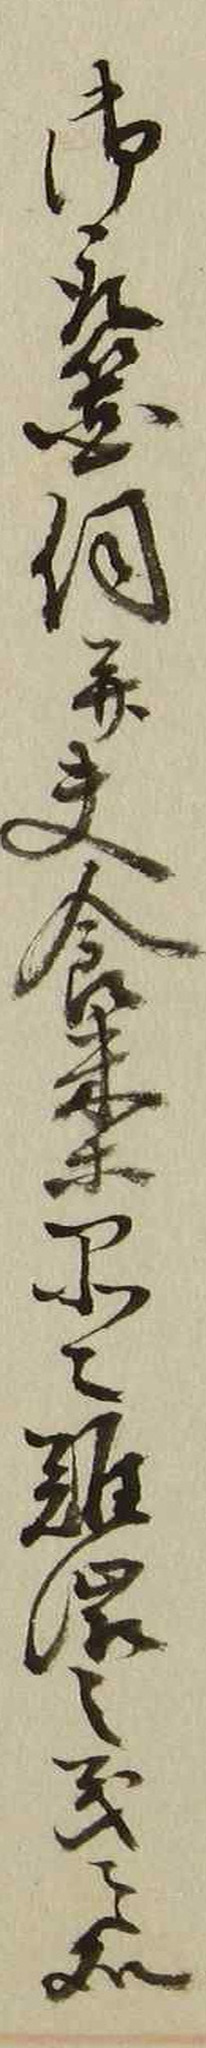御取箇伺并夫食米等品々難渋之義に候処
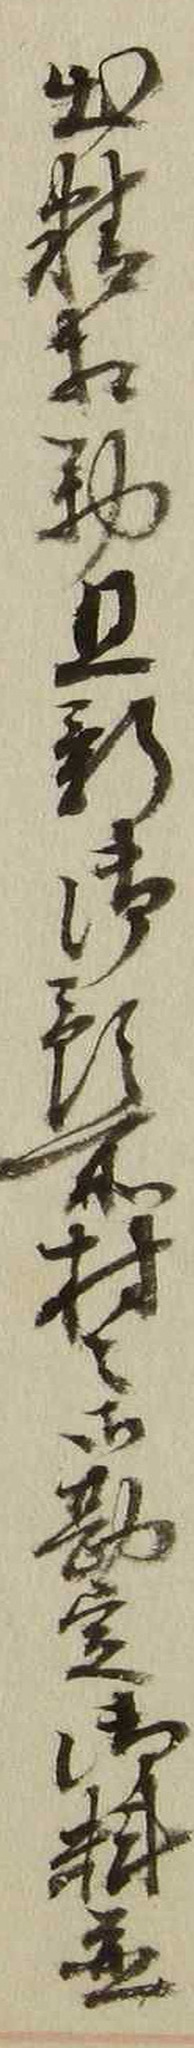出精相勤且新御預所村々御勘定御料並
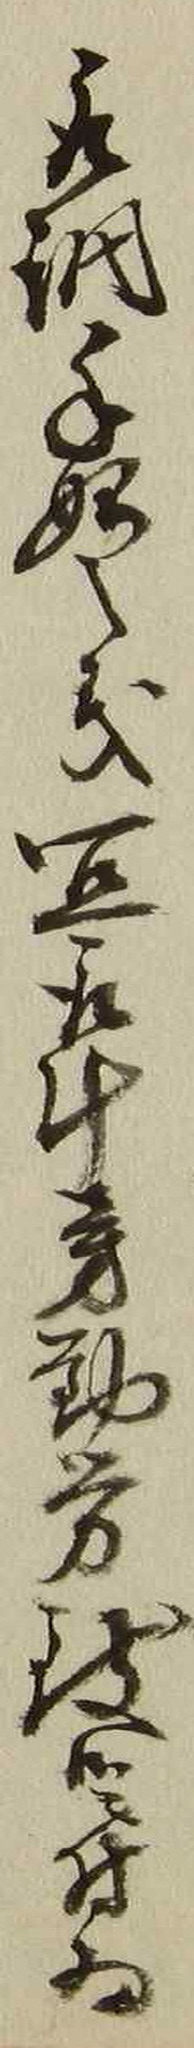取調手始之義宜取計旁勤労致候に付為
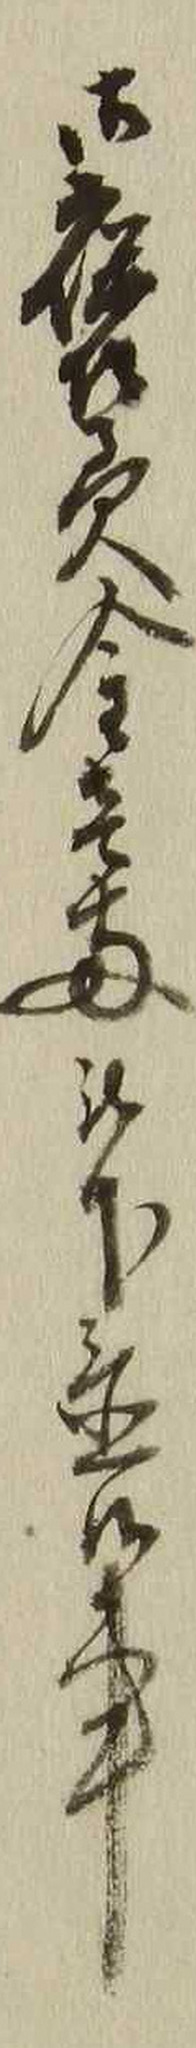御褒美金壱両被下置候事
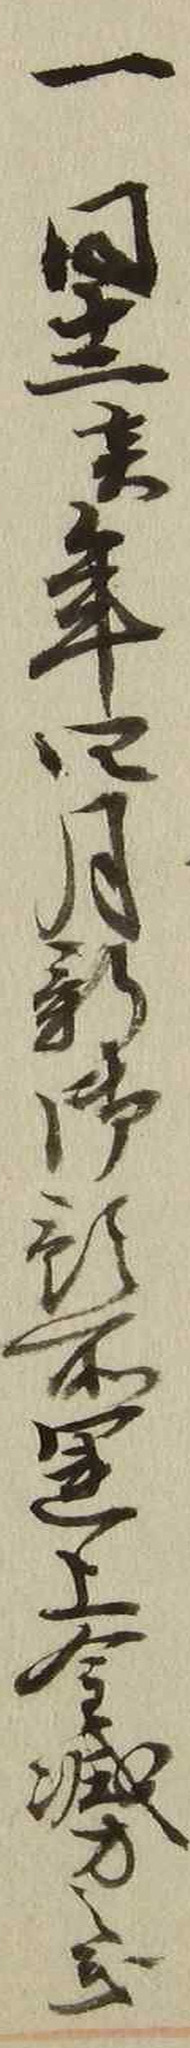一同十二亥年四月新御預所運上近金減方之義
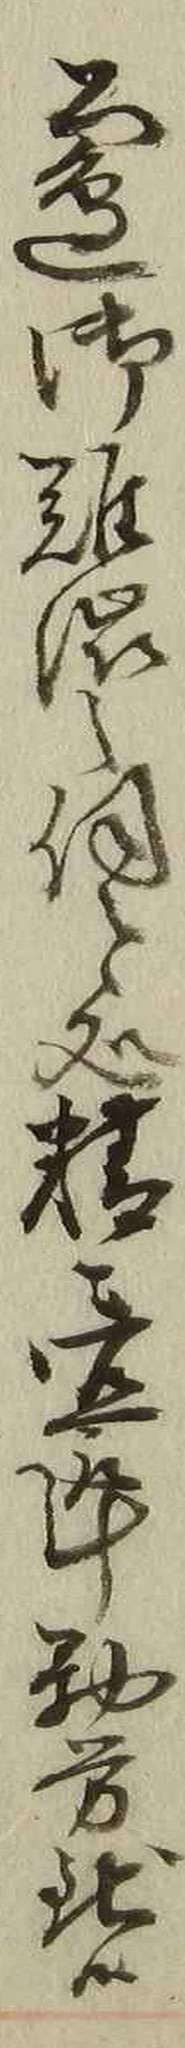公辺御難渋之伺候処精々宜取計勤労致候
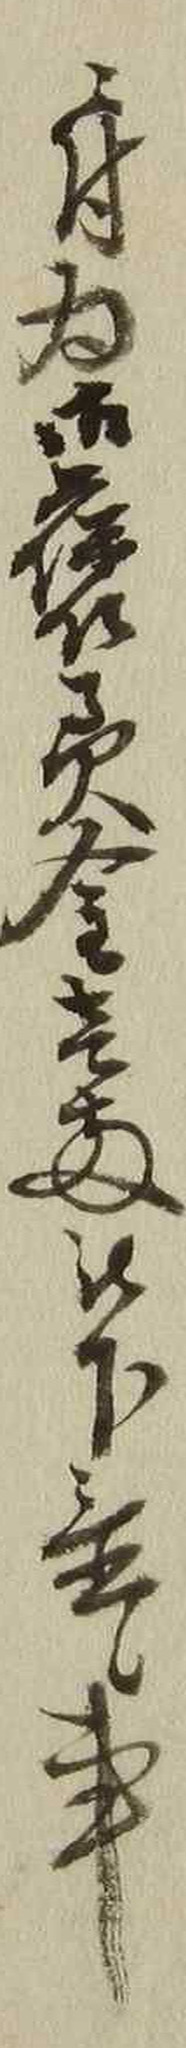に付為御褒美金壱両被下置候事
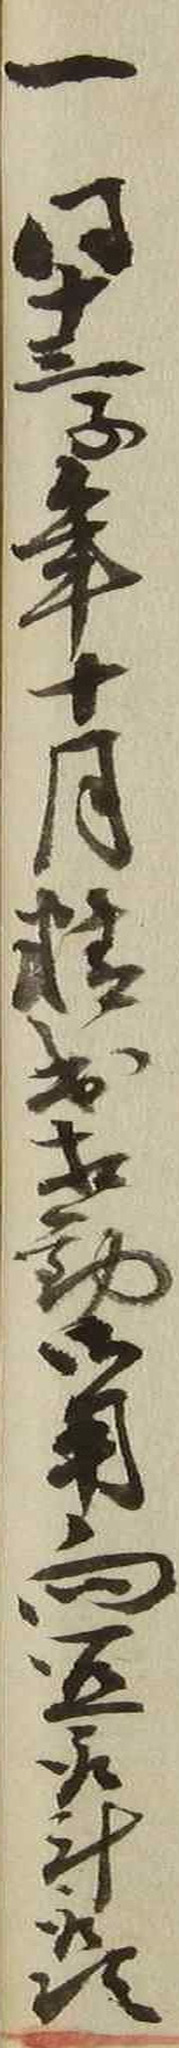一同十三子年十月精出相勤御用向宜取計取次
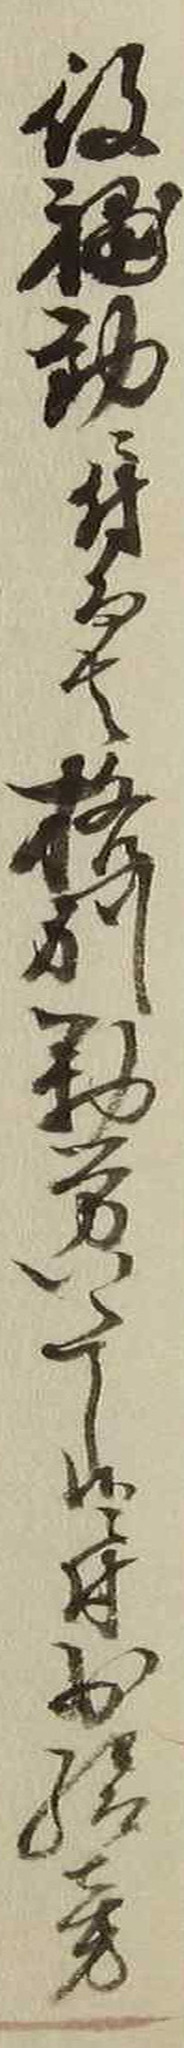役補助に付而は格別勤労いたし候に付少給旁
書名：諸士系譜　巻之38　は之部6
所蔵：会津若松市立会津図書館
